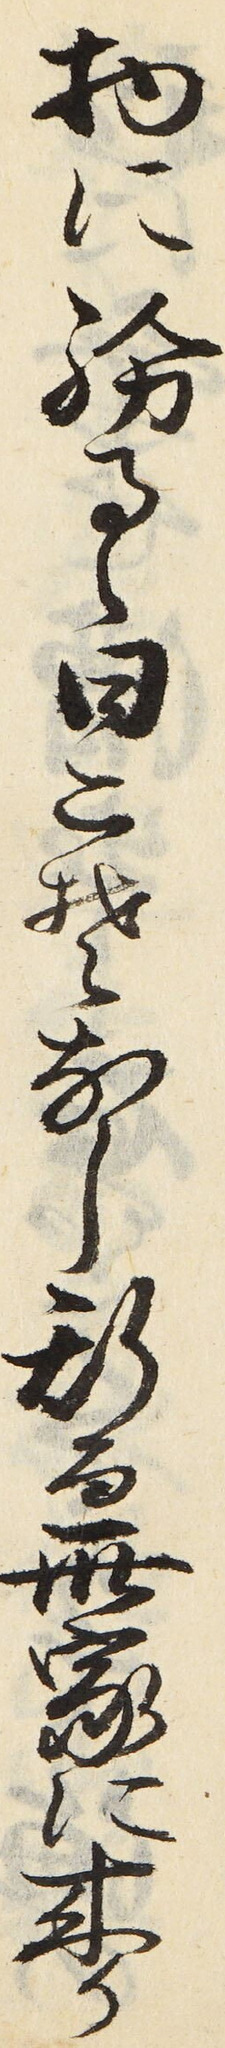物に紛るゝ日こそなし斯而此家に来り
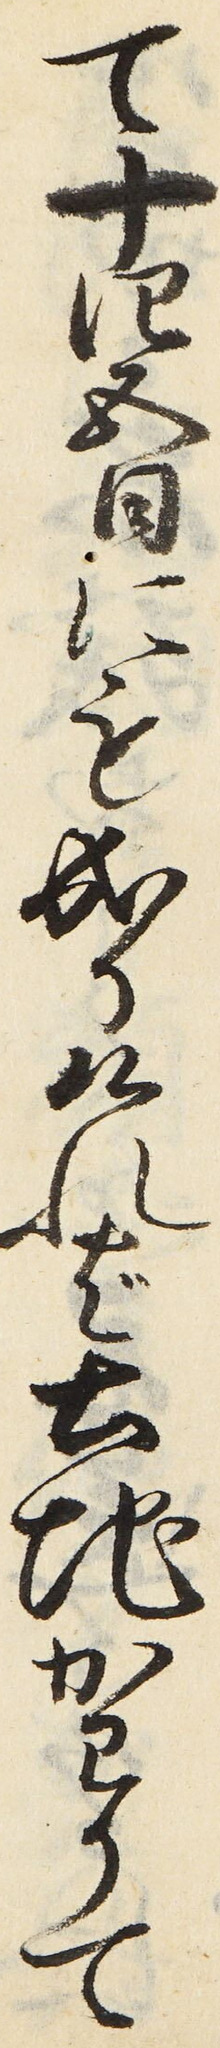て十四五日にも成りければ土地かわりて
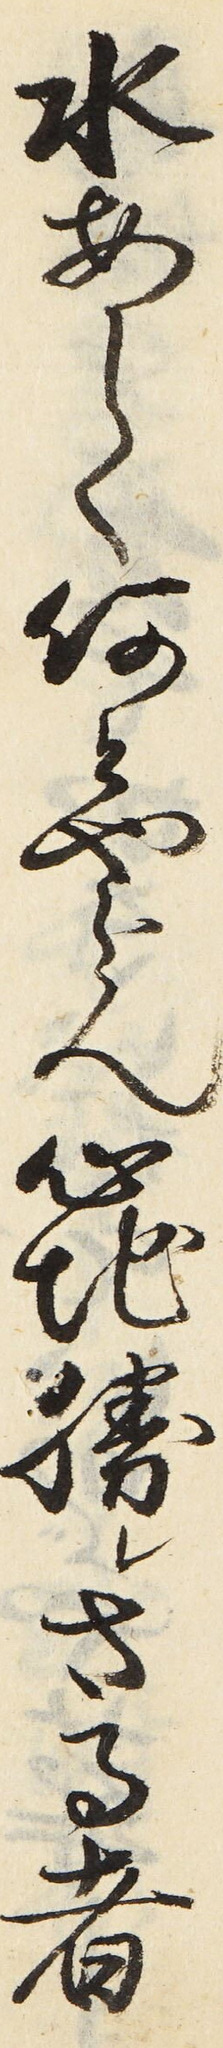水あしく何とやらん心地勝れさる者
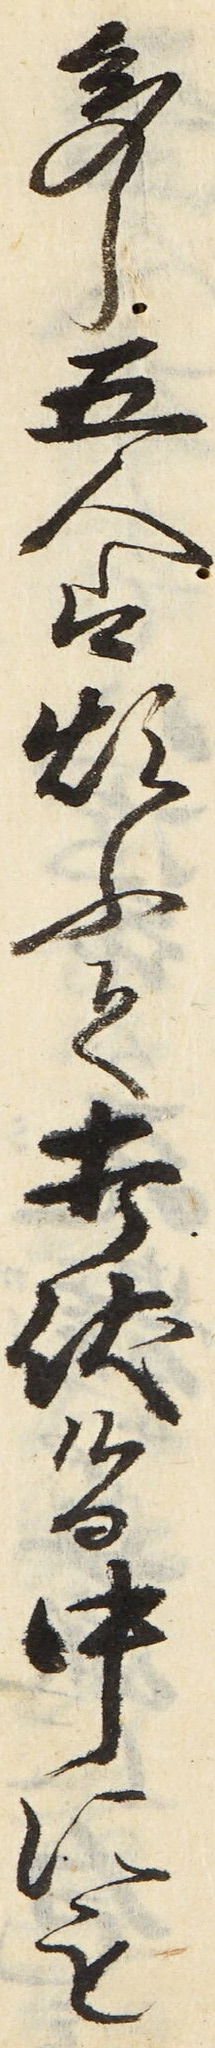多し五人は煩ふて打伏ける中にも
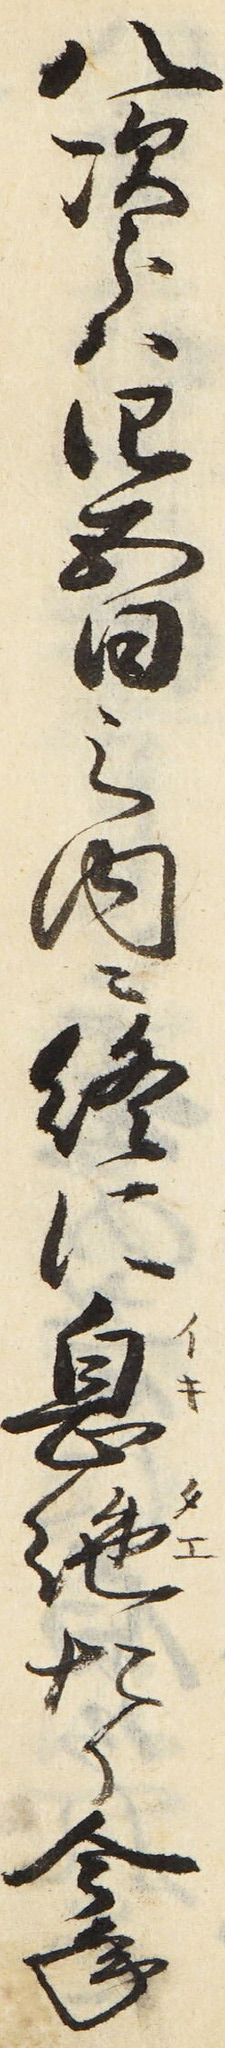八次郎は四五日之内に終に息絶た
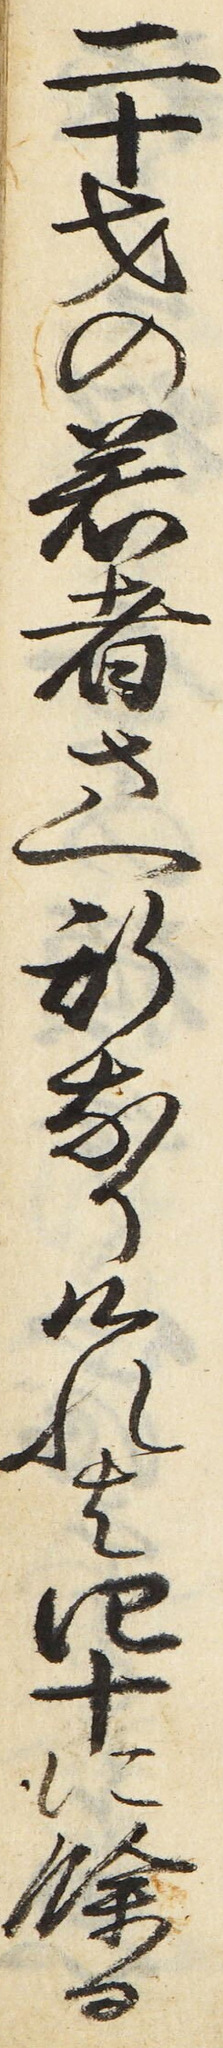二十才の若者さへ斯なりけれは四十に余る

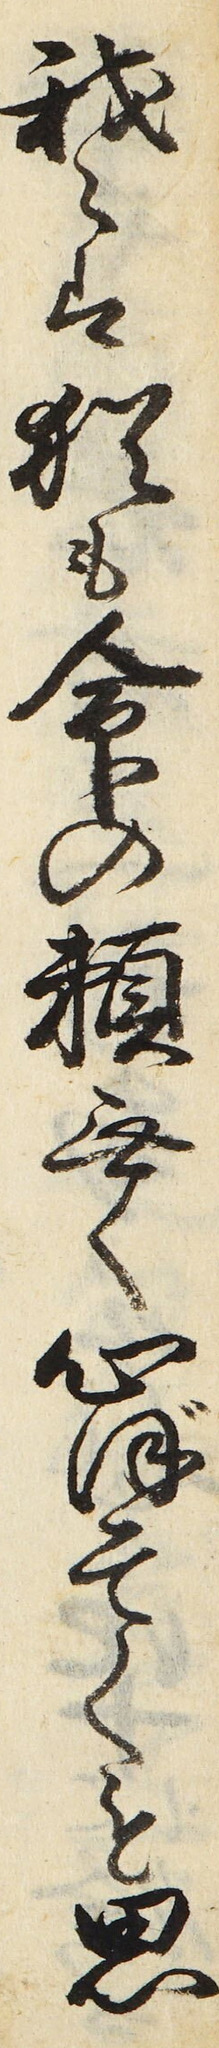我々は猶も命の頼無く心ぼそくも思
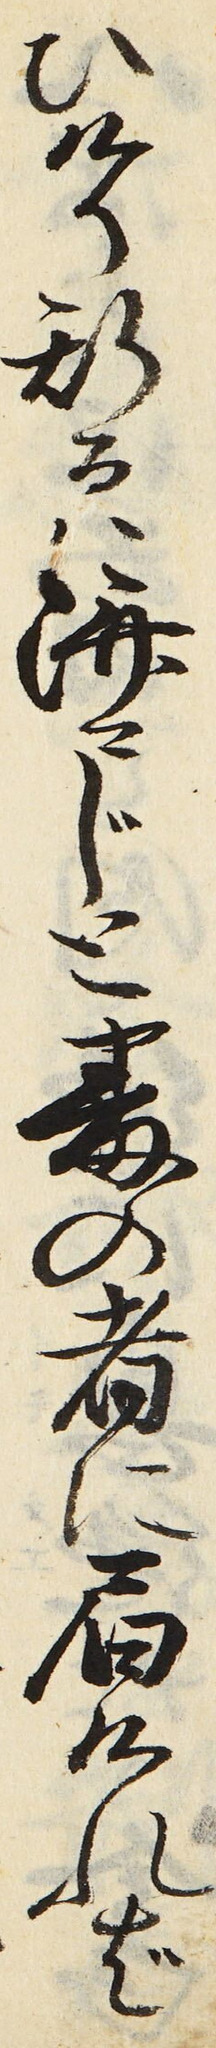ひけり斯而は済まじと番の者に届ければ
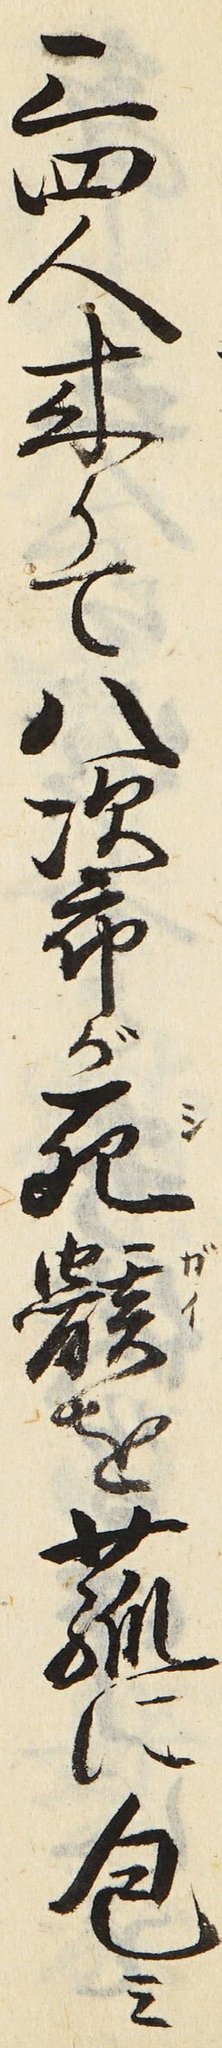三四人来りて八次郎が死骸を菰に包み
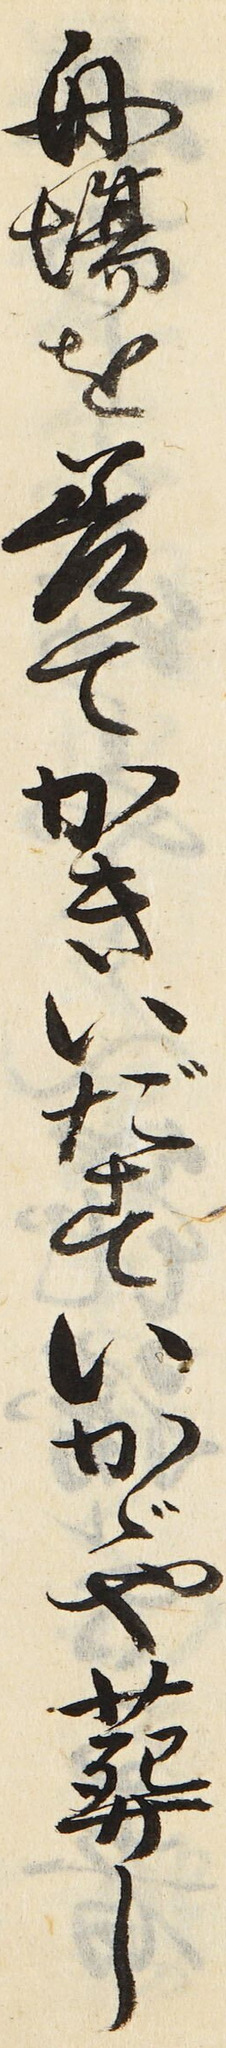舟場を差てかきいだすいかゞや葬し
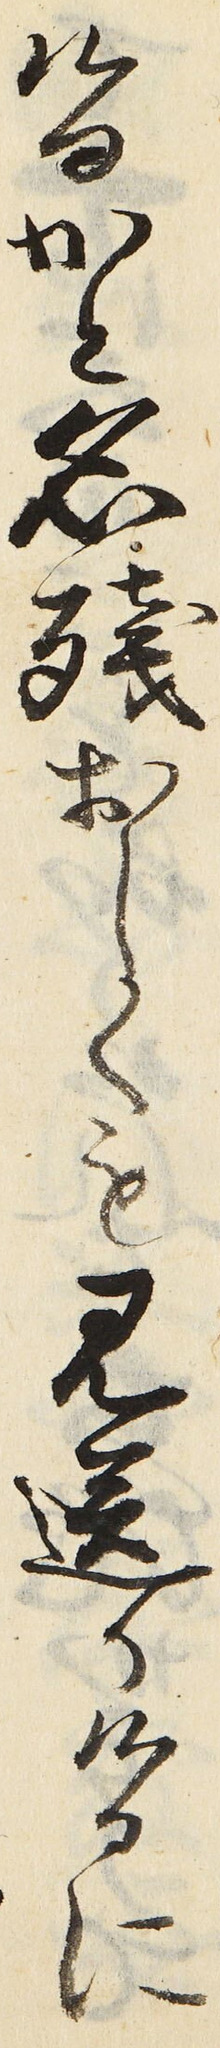けるかと名残おしくも見送りけるに
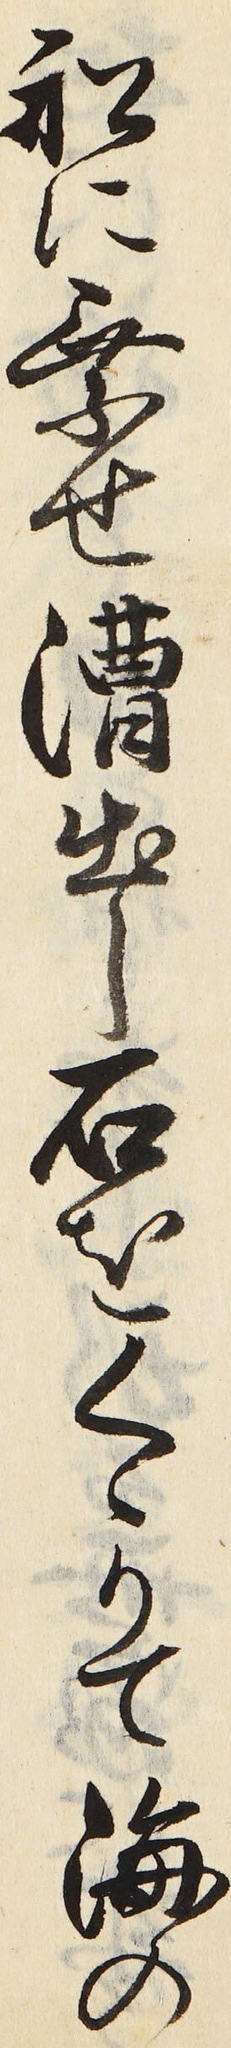船に乗せ漕出し石をくゝりて海の
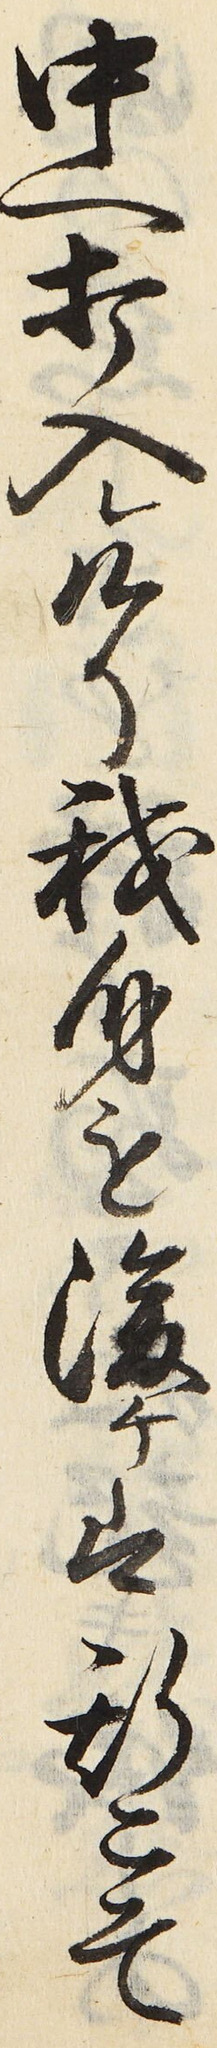中へ打入れけり我身も後ちは斯こそ
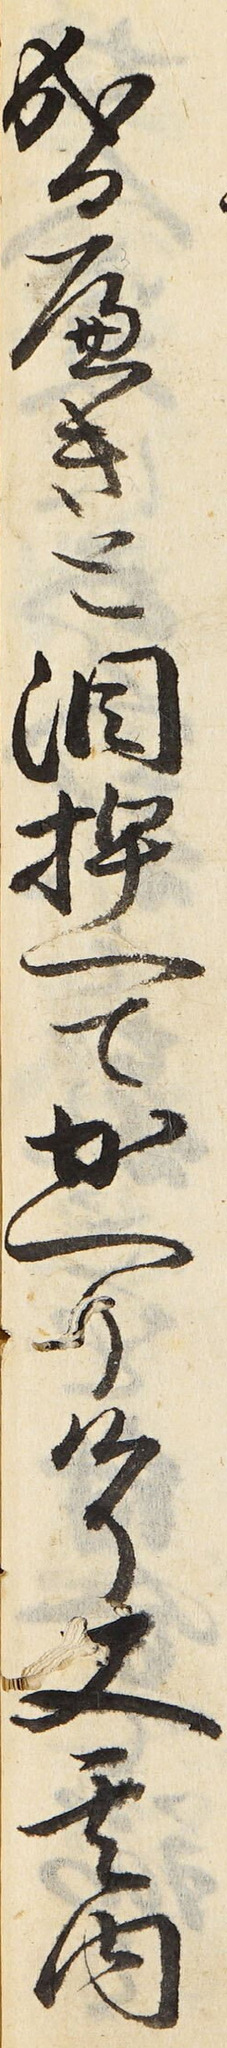成るへきと泪押へてかへりけり又其内
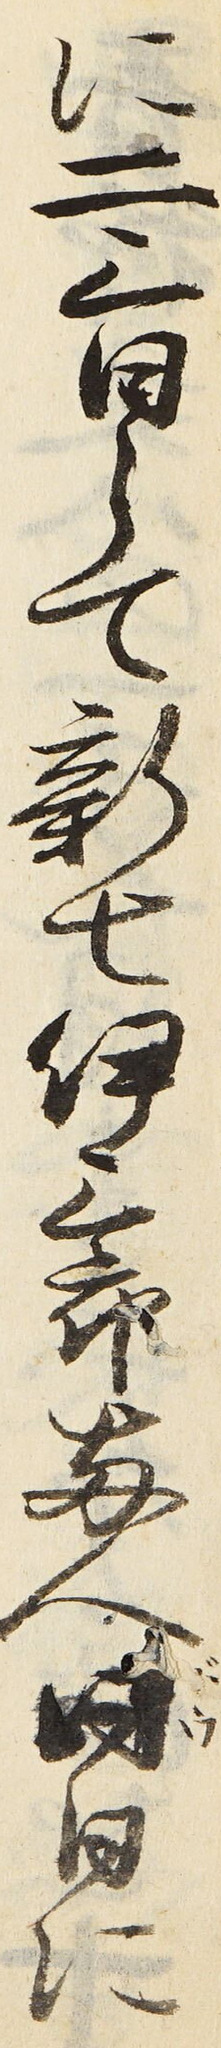に二三日して新七伊三郎両人同日に
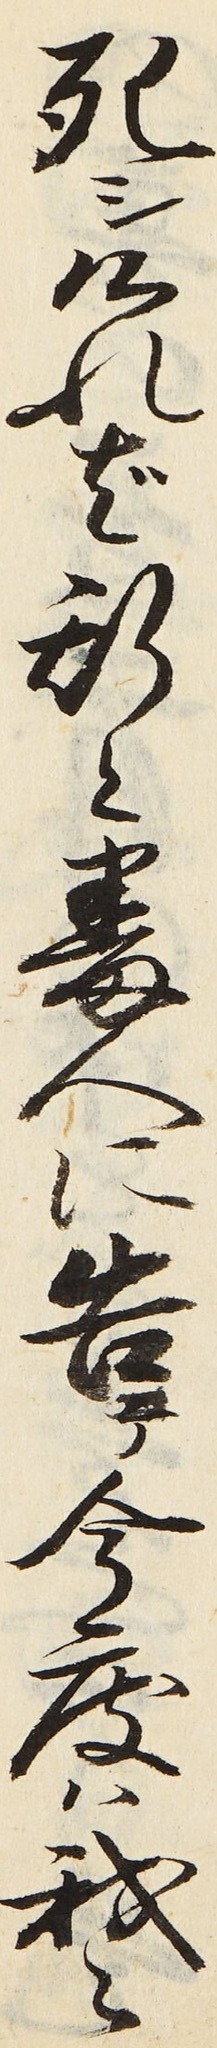死シければ斯と番人に告テ今度は我々
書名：華夷九年録
